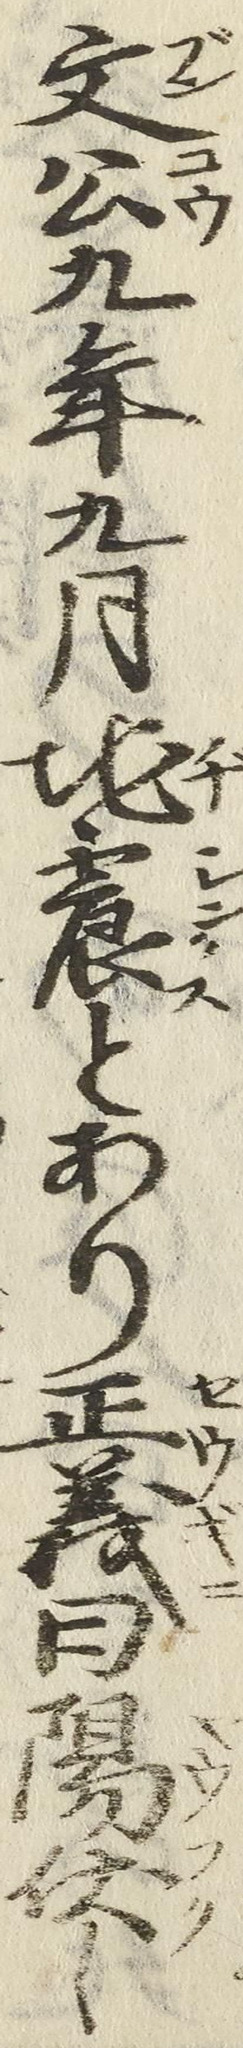文公九年九月地震とあり正義曰陽伏し
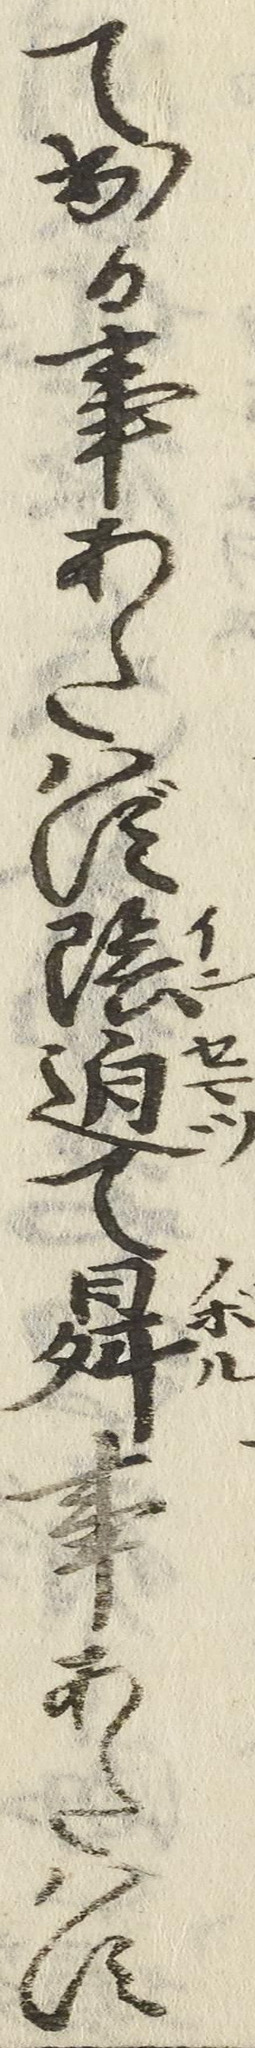て出る事あたはず陰迫て昇事あたはす
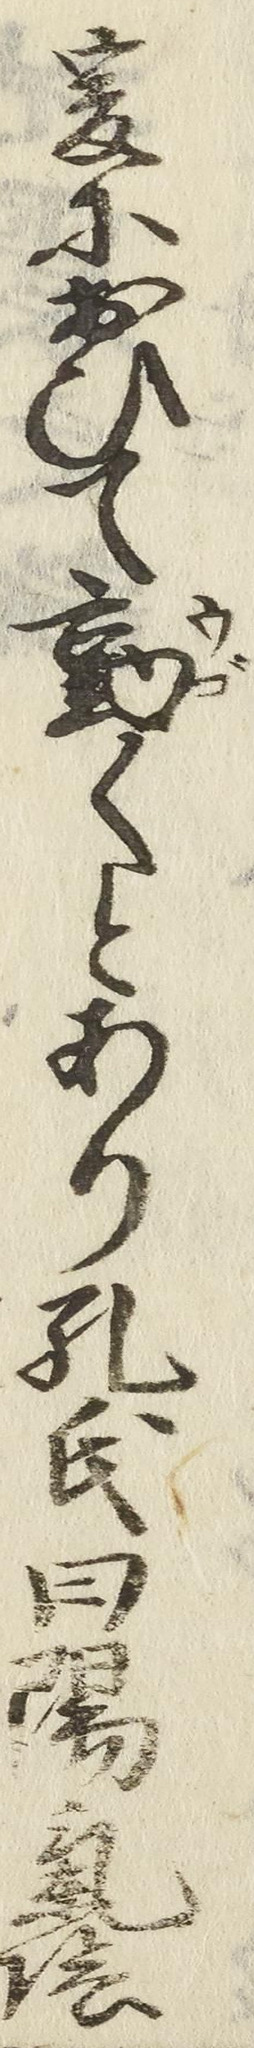爰におひて動くとあり孔氏曰陽気陰
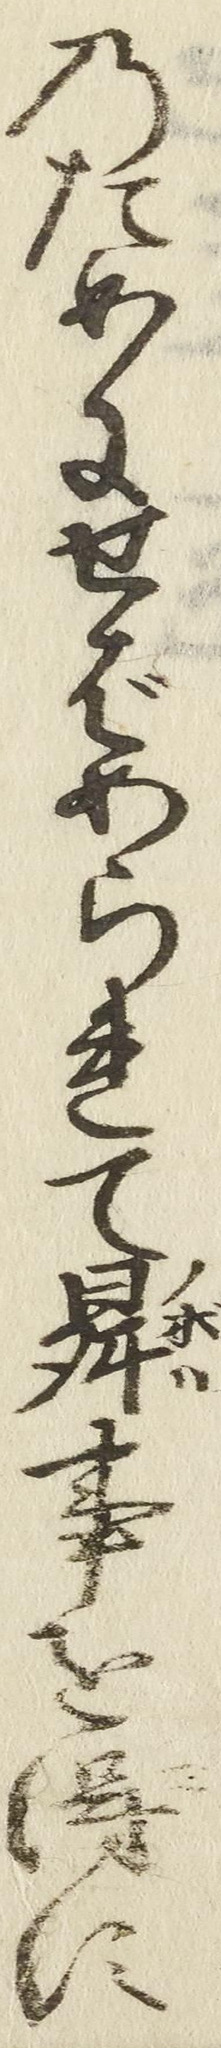のためにせばめられて昇事を得す
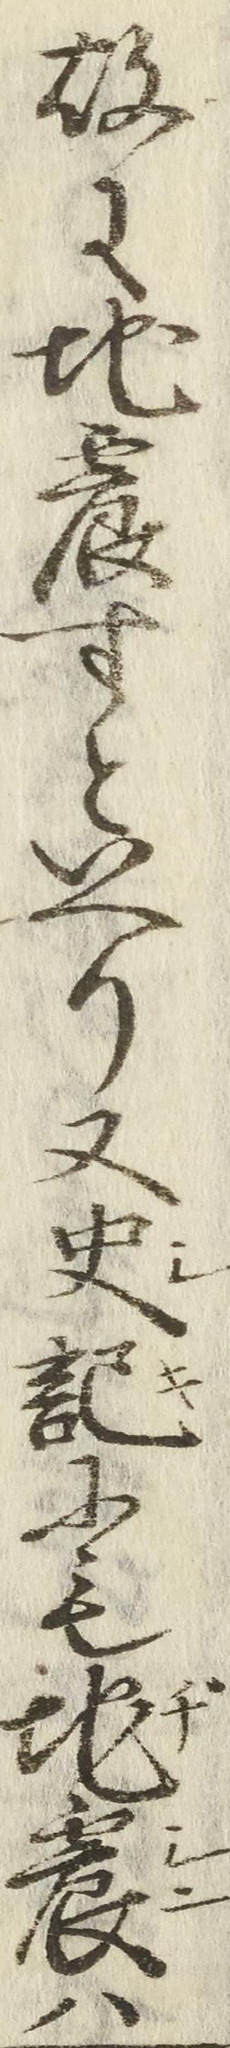故に地震すといへり又史記にも地震は
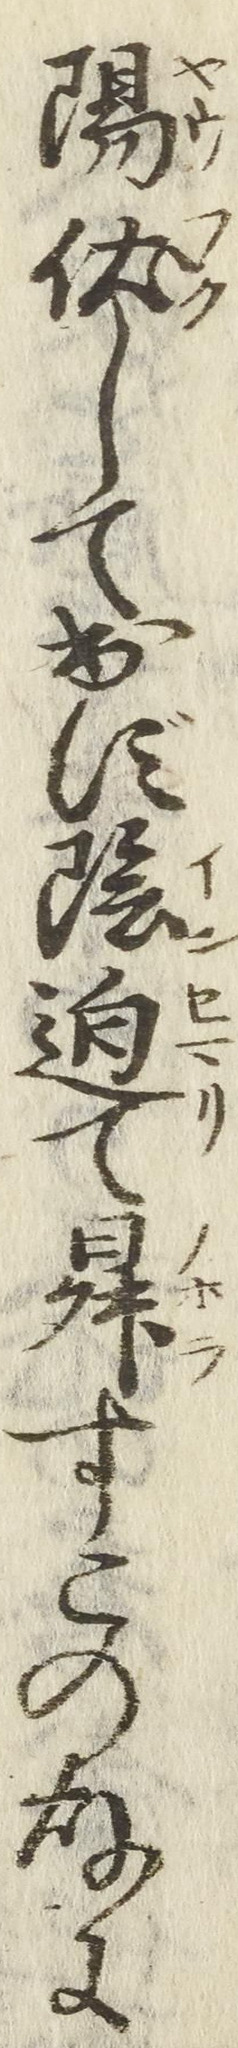陽伏して出ず陰迫て昇すこの故に
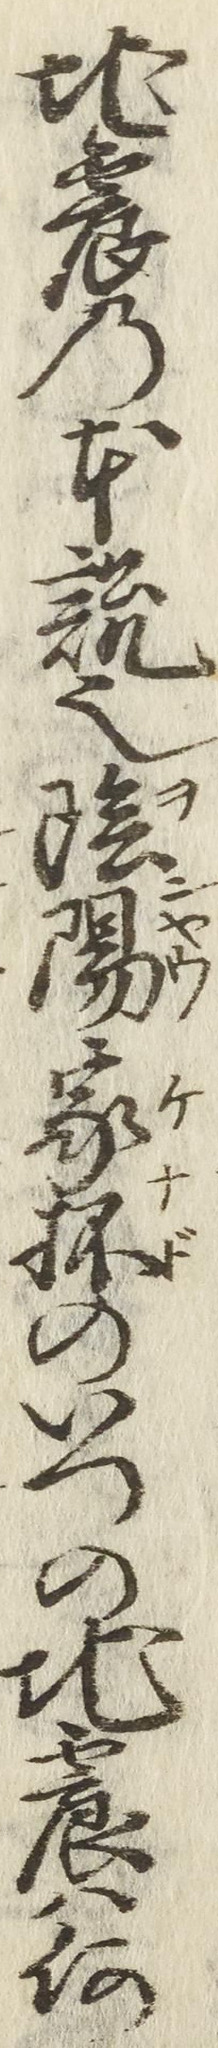地震の本説也陰陽家抔のいつの地震は何
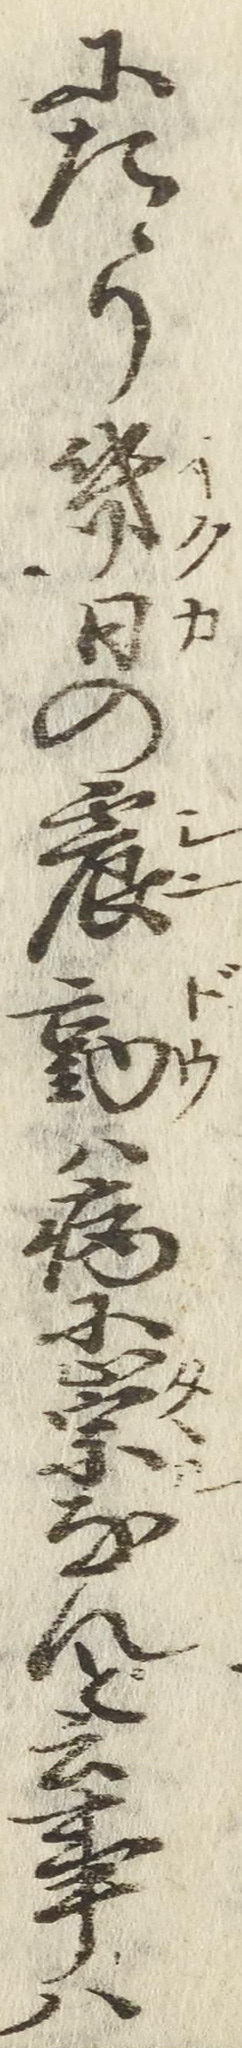にたゝり幾日の震動は病に祟なんど云事は
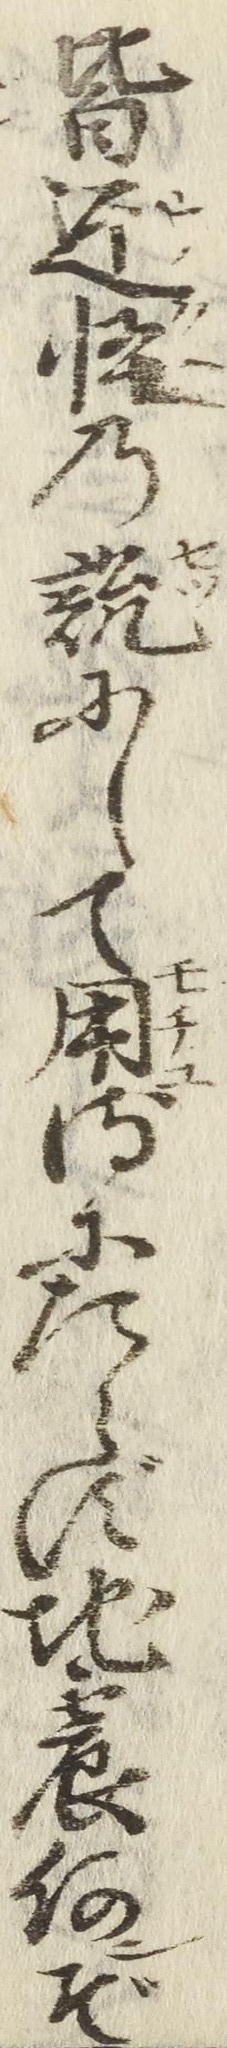皆迂怪の説にして用るにたらず地震何ンぞ
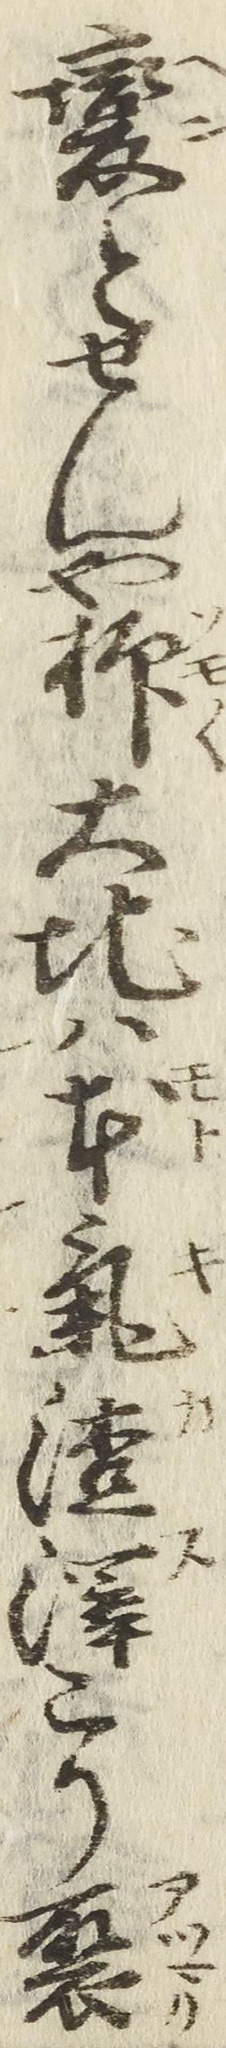変とせんや抑大地は本気渣滓こり聚
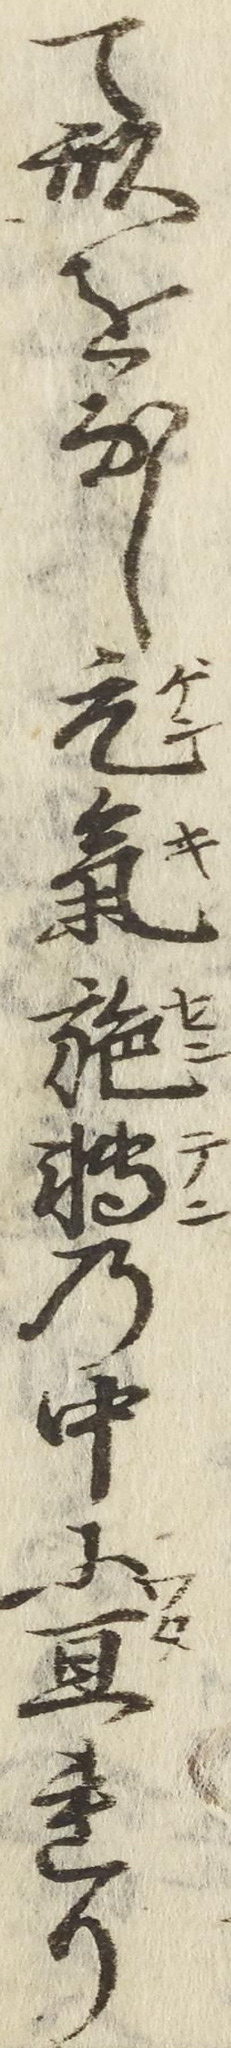て形をなし元気旋転の中に亘れり

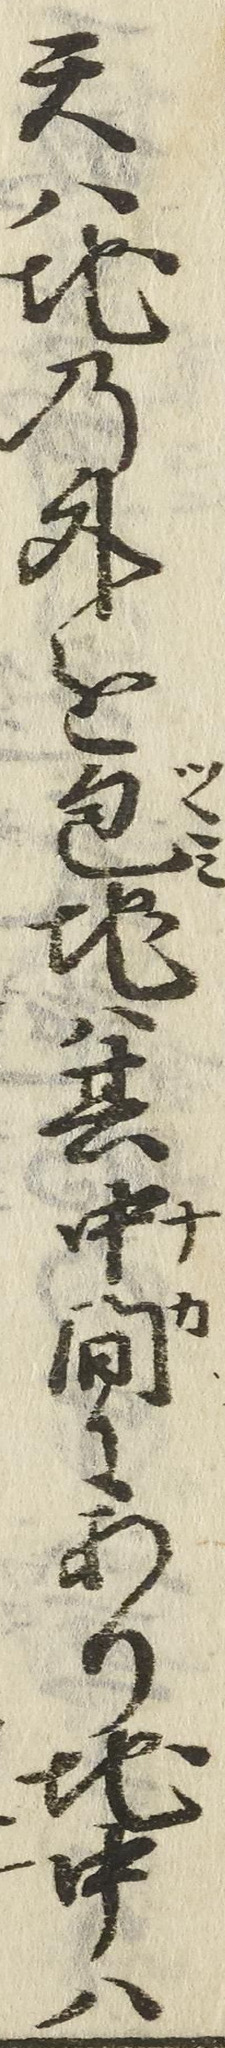天は地の外を包地は其中間ににあり地中は
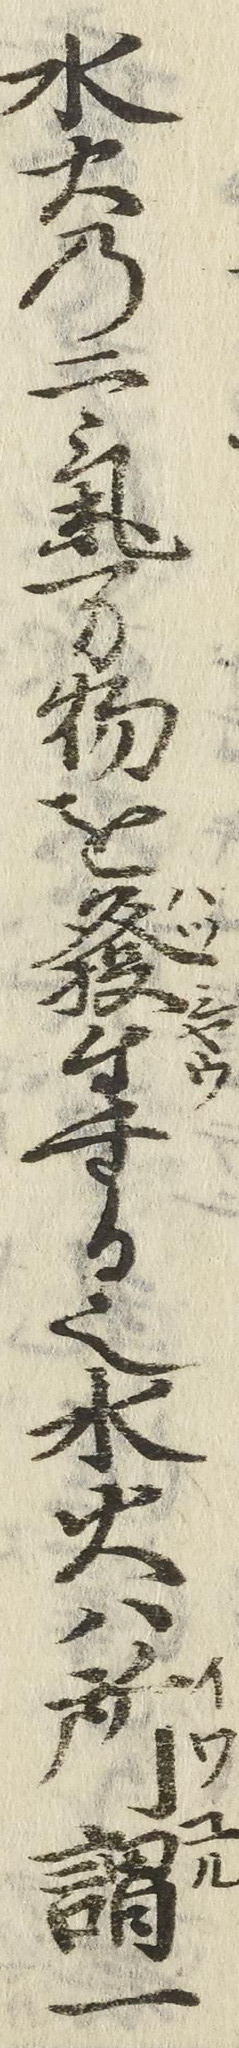水火のニ気万物を発生する也水火は所謂一
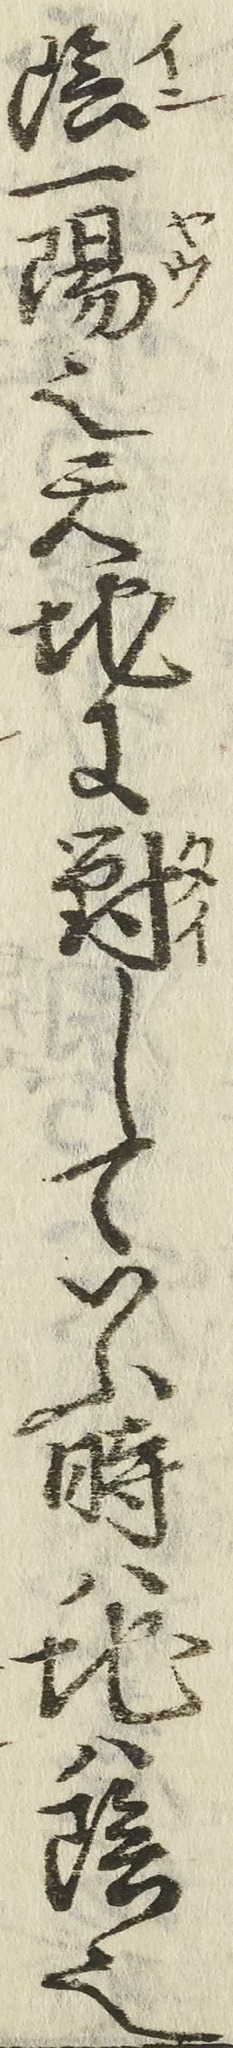陰一陽也天地に対していふ時は地は陰也
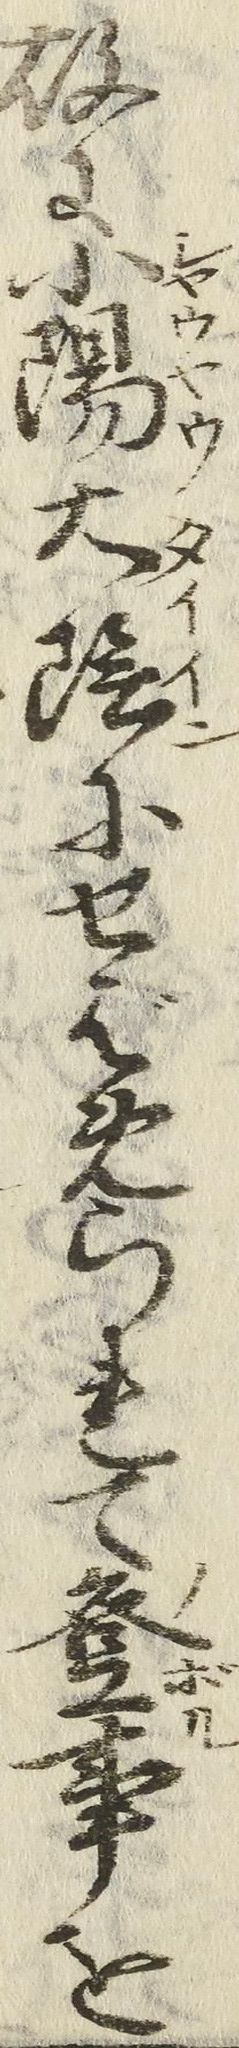故に小陽大陰にせばめられて登事を
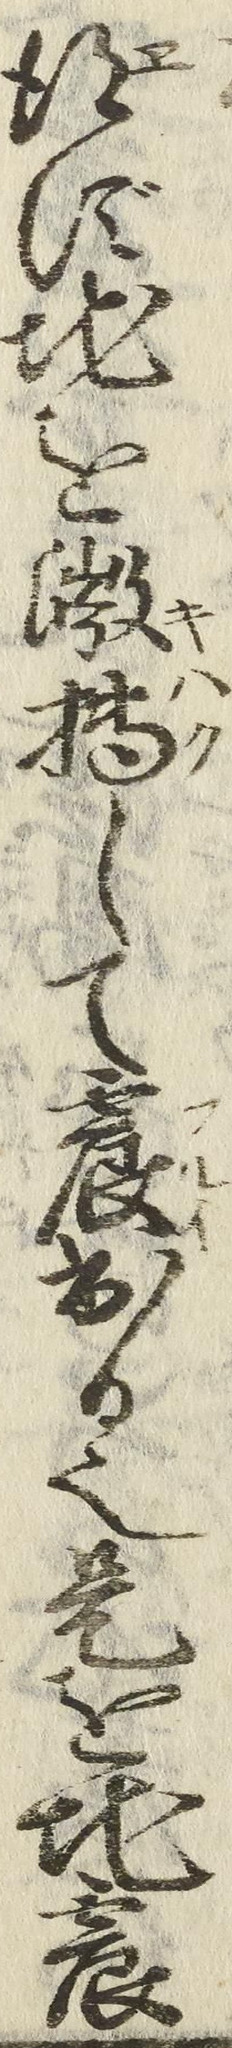得ず地を澂搏して震出る也是を地震
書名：天地或問珍　天
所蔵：東京大学地震研究所図書室 Earthquake Research Institute Library, The University of Tokyo, JAPAN
